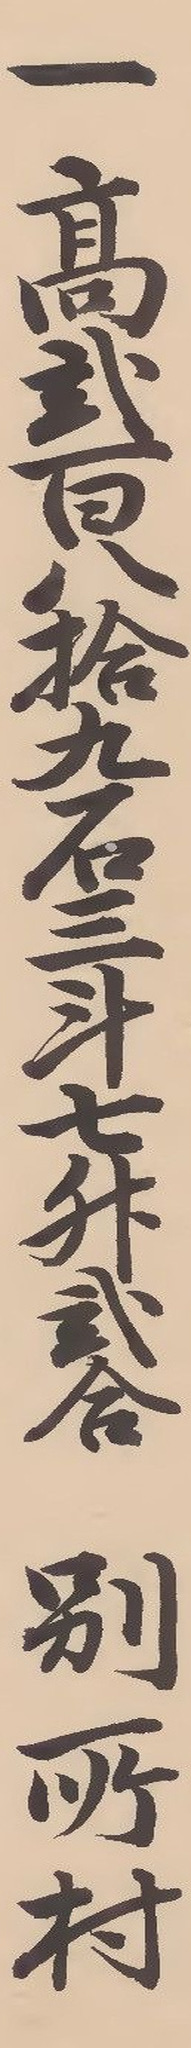一高弐百八拾九石三斗七升弐合別所村
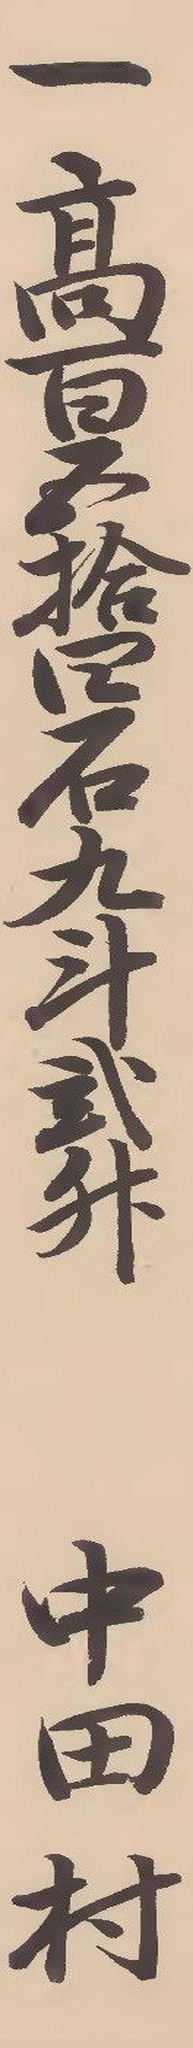一高百五拾四石九斗弐升中田村
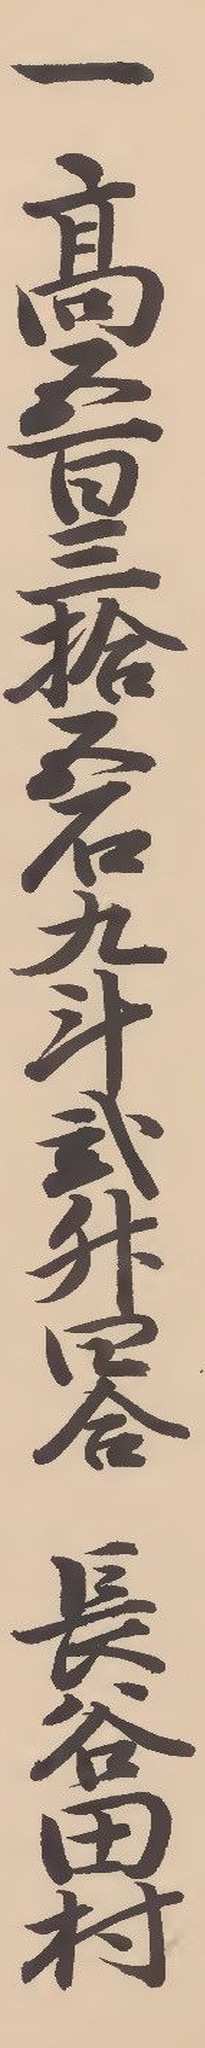一高五百三拾五石九斗弐升四合長谷田村
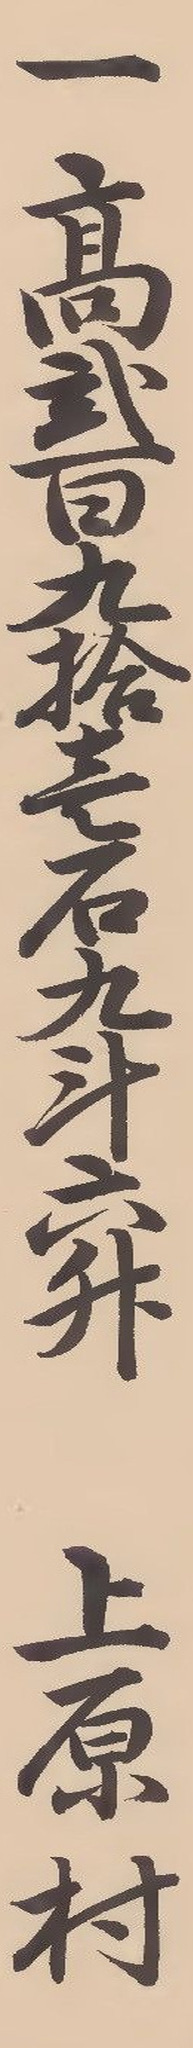一高弐百九拾壱石九斗六升上原村
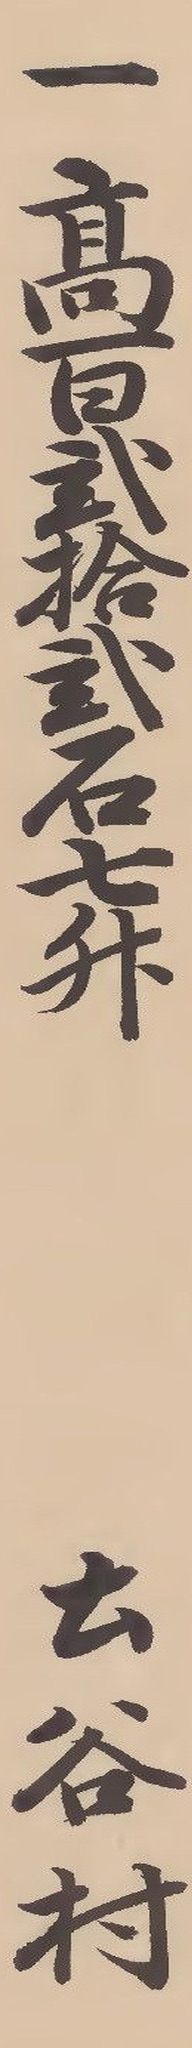一高百弐拾弐石七升土谷村
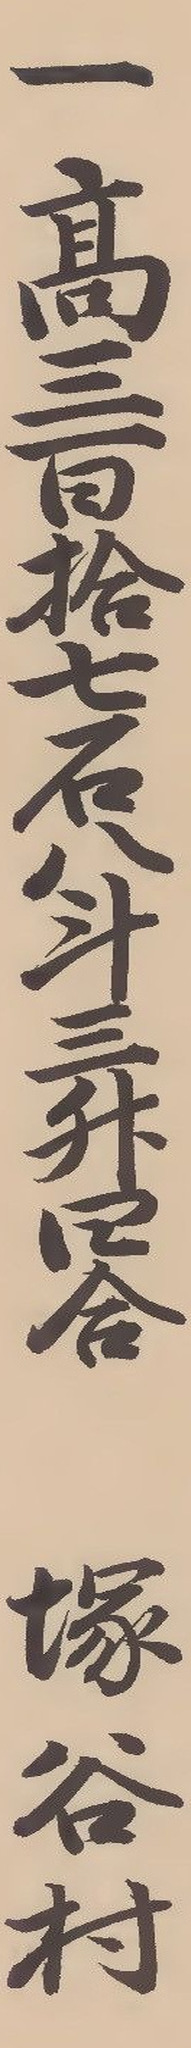一高三百拾七石八斗三升四合塚谷村
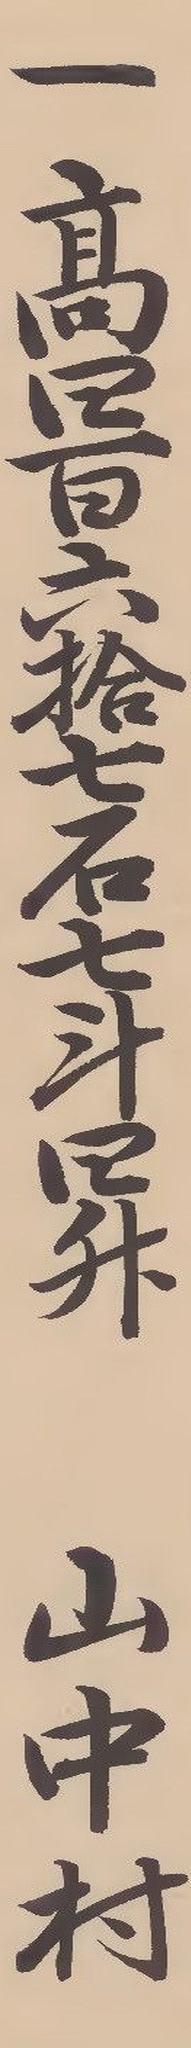一高四百六拾七石七斗四升山中村
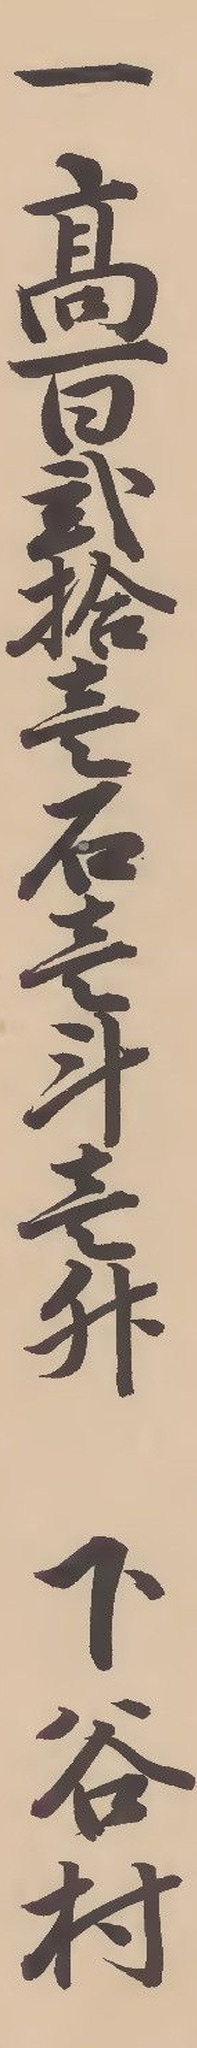一高百弐拾壱石壱斗壱升下谷村

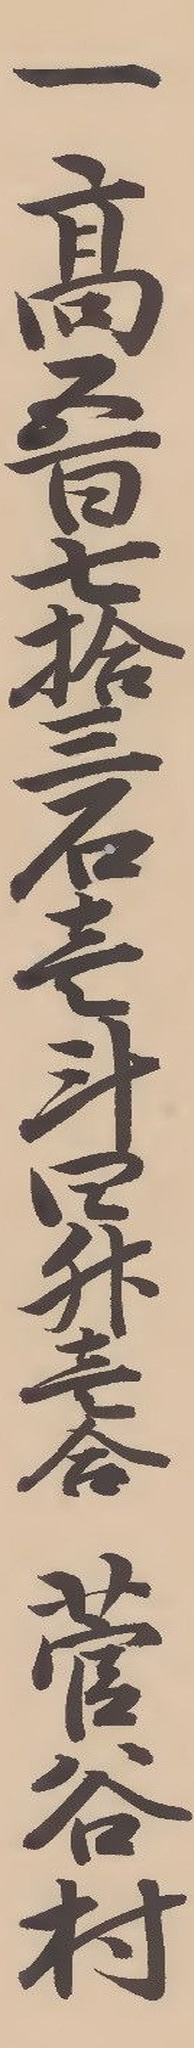一高五百七拾三石壱斗四升壱合菅谷村
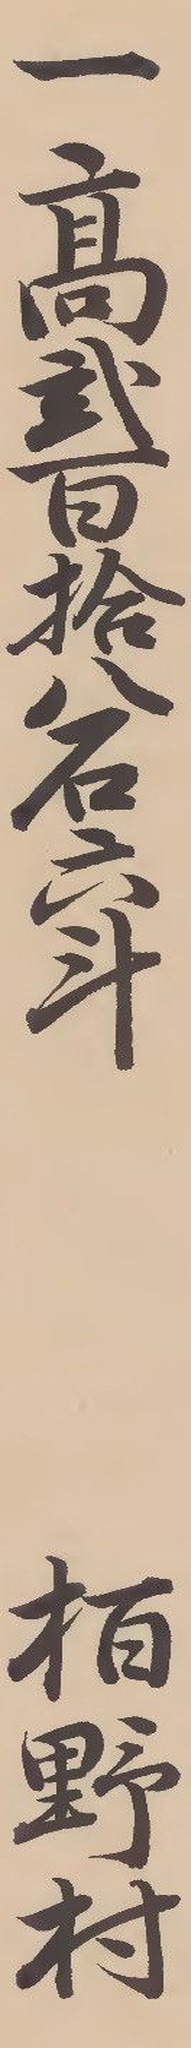一高弐百拾八石六斗栢野村
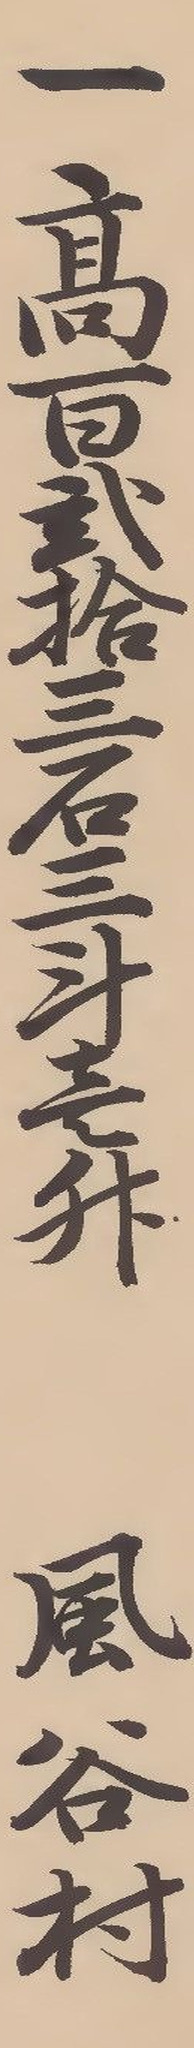一高百弐拾三石三斗壱升風谷村
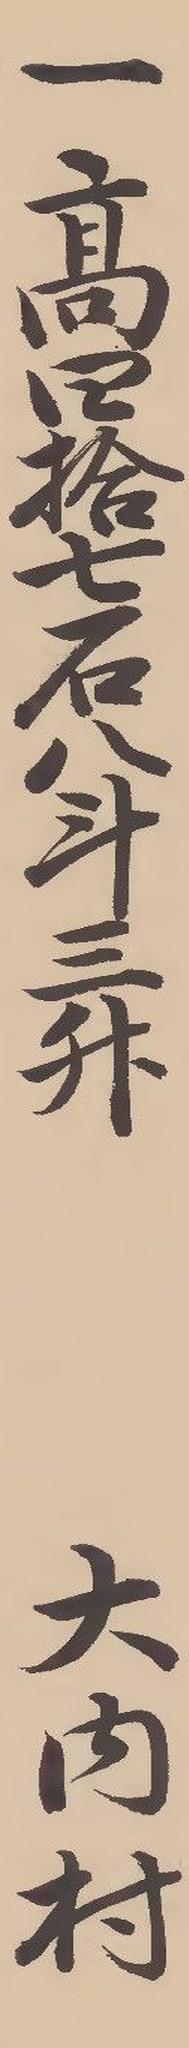一高四拾七石八斗三升大内村
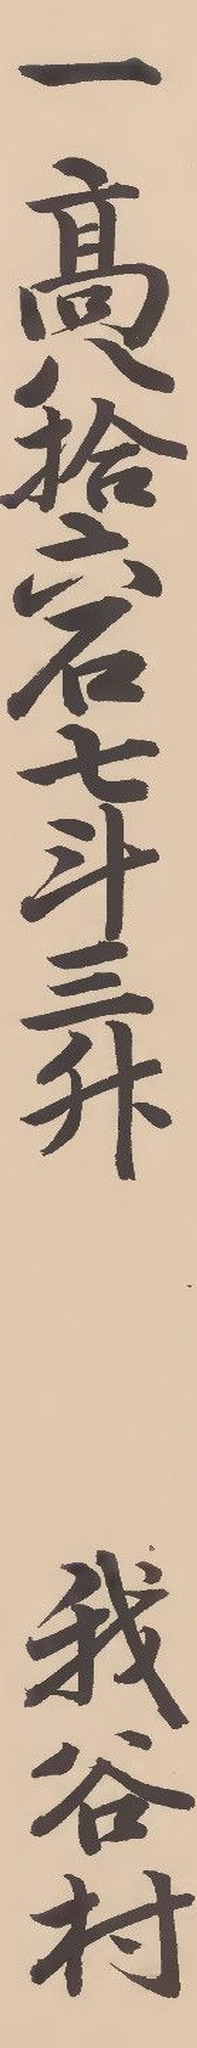一高八拾六石七斗三升我谷村
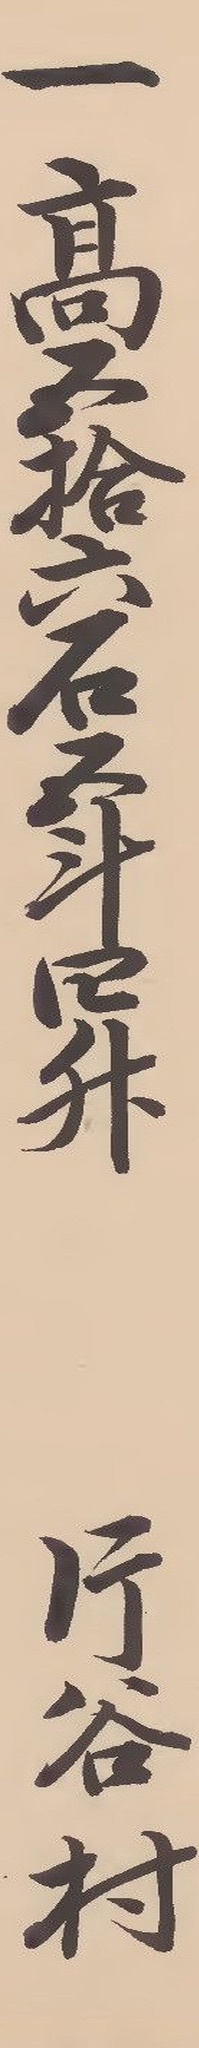一高五拾六石五斗四升片谷村
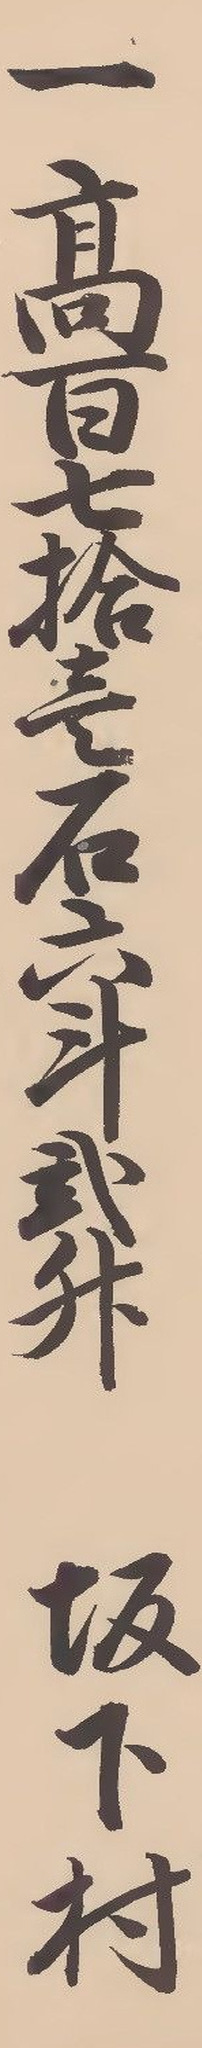一高百七拾壱石六斗弐升坂下村

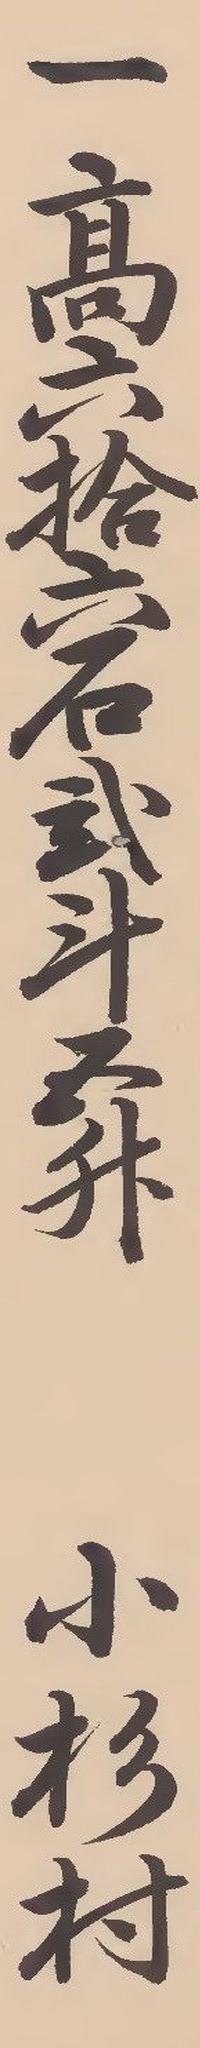一高六拾六石弐斗五升小杉村
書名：加賀国郷帳
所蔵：国立公文書館 National Archives of Japan
